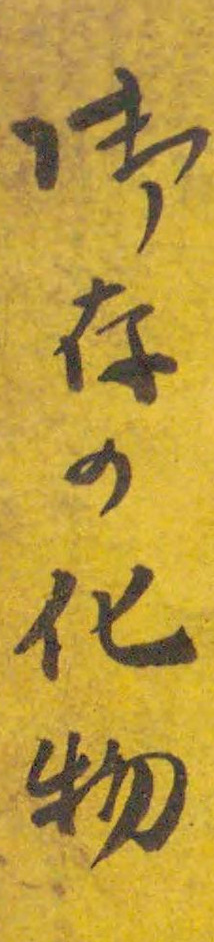御存の化物

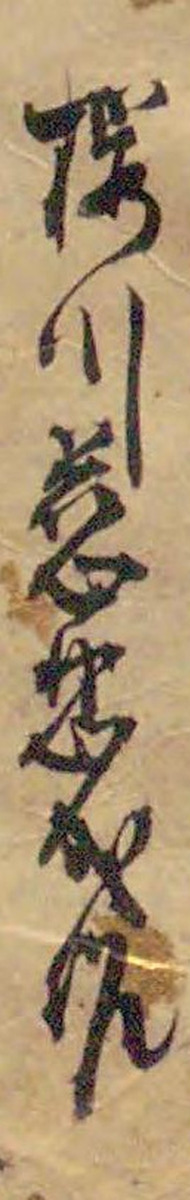桜川慈悲成作
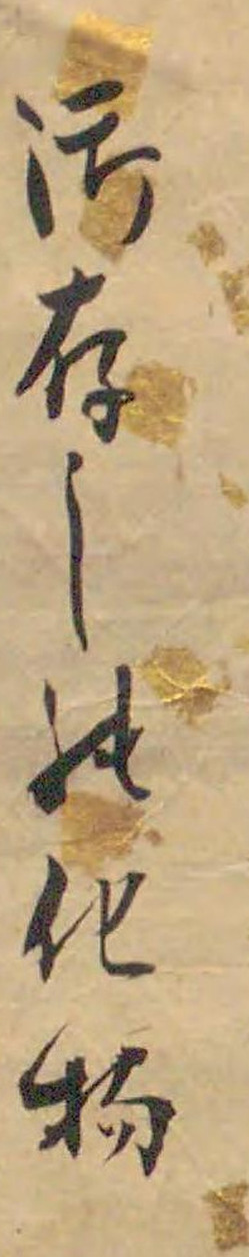御存しの化物
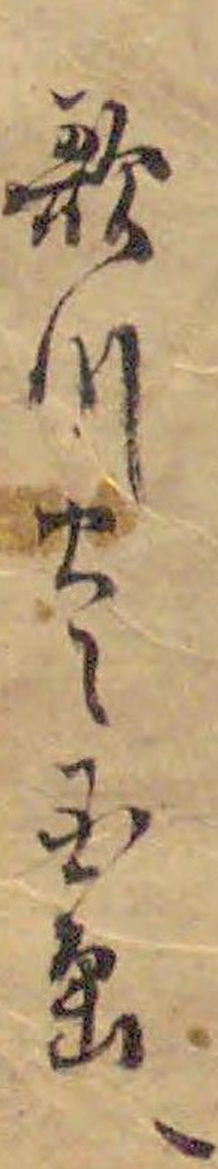歌川豊国画

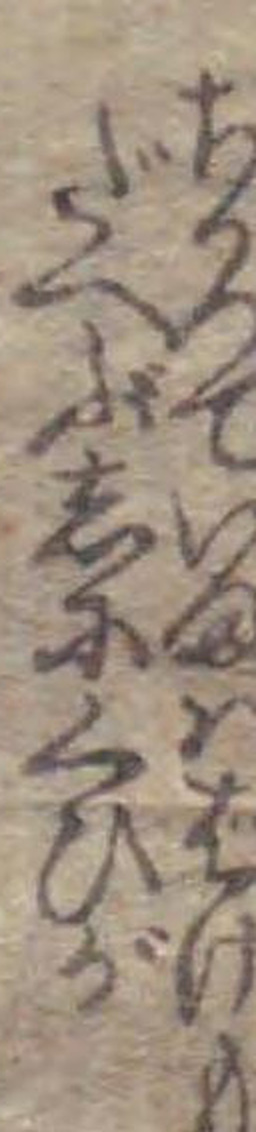だへぶしにくひが

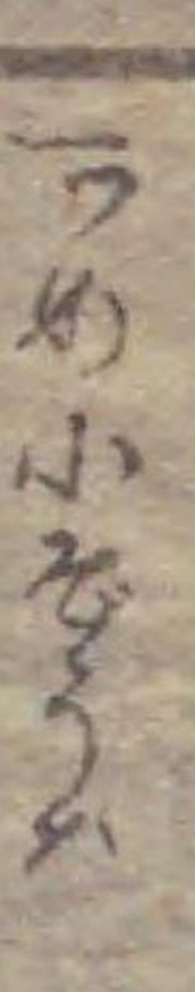一ツめ小ぞうは
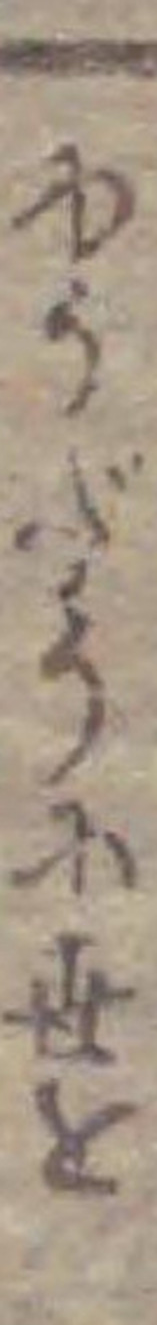にうだうに世を
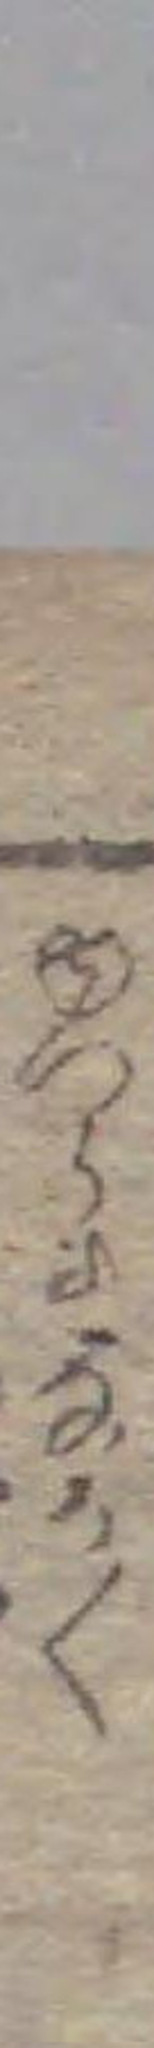ゆつられなか〳〵
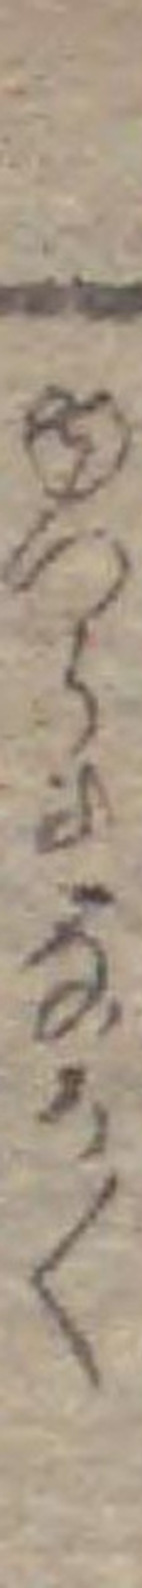ゆつられなか〳〵
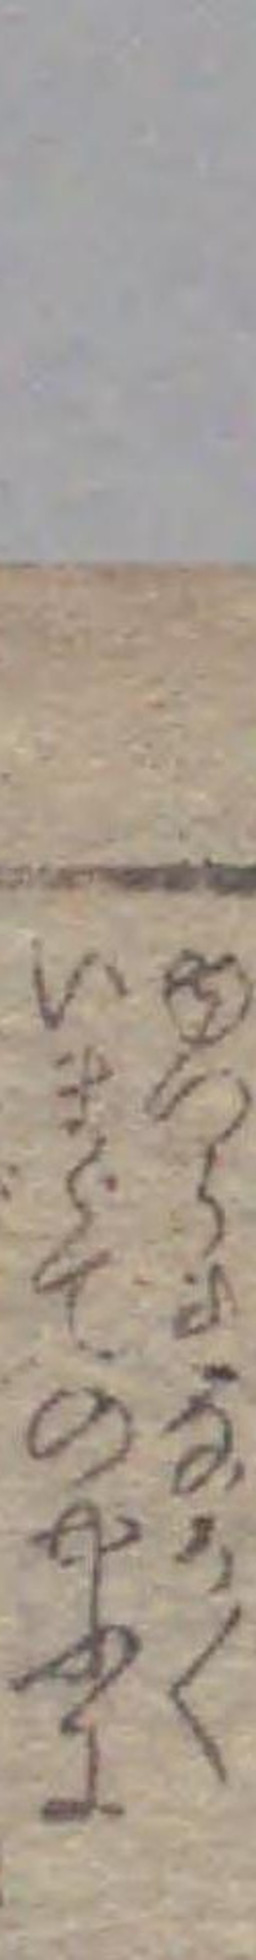いまゝでのやふに
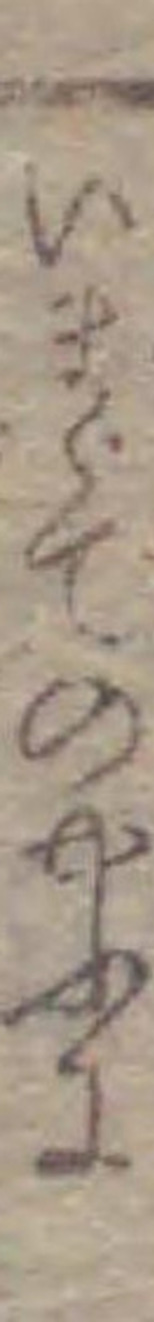いまゝでのやふに
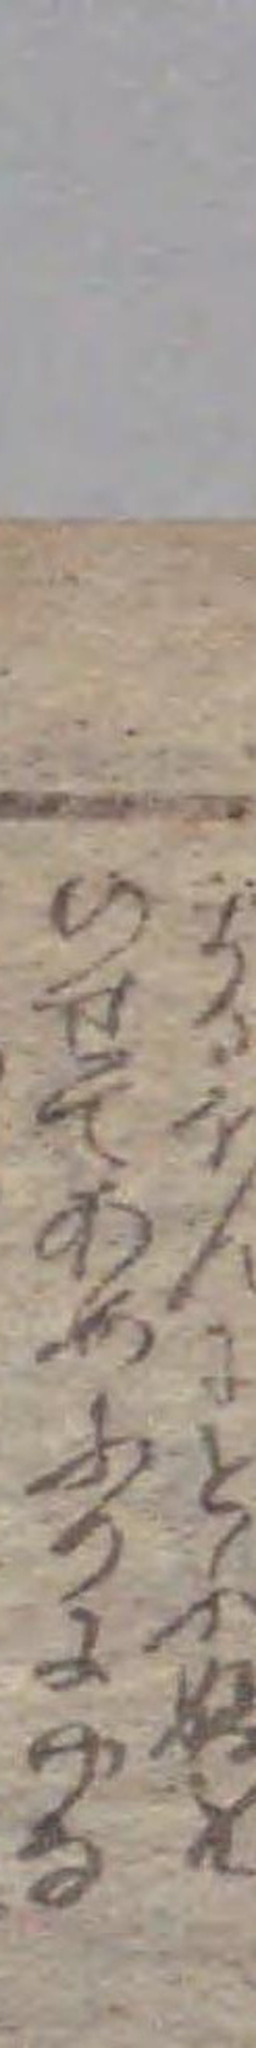のせてあめふりにやな
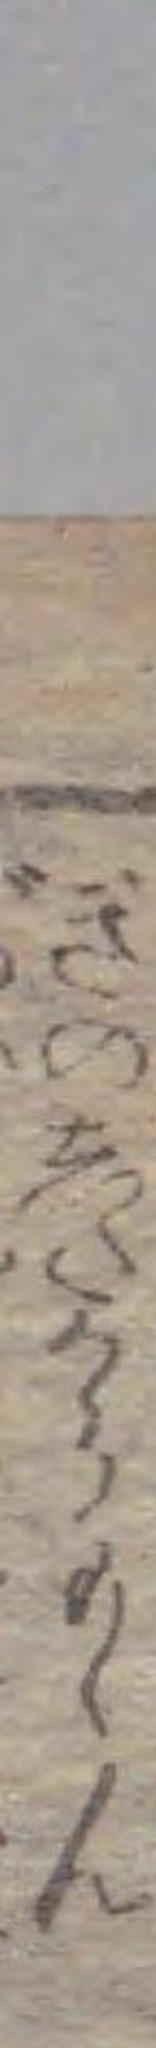ぎのしたからもゝん
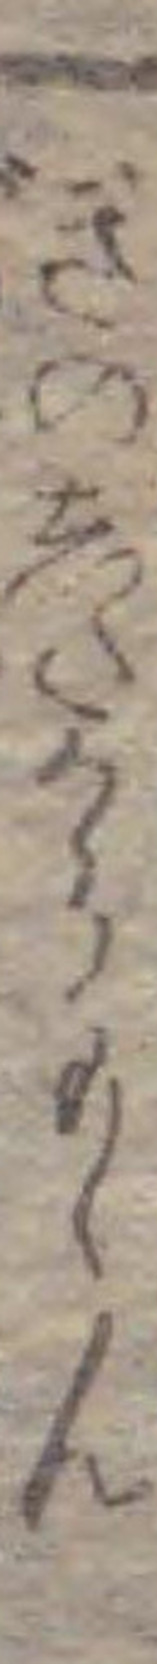ぎのしたからもゝん
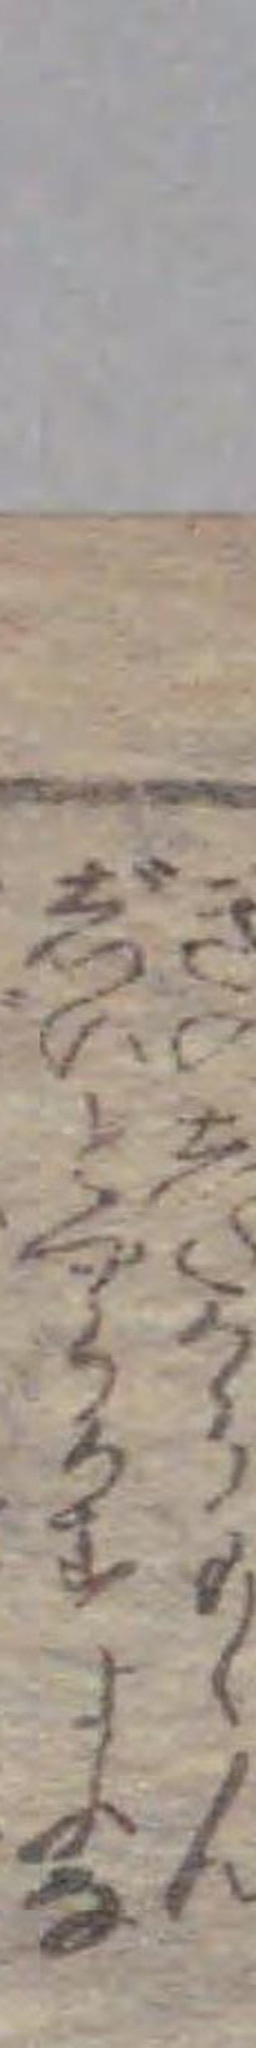じいとやらかすよふな
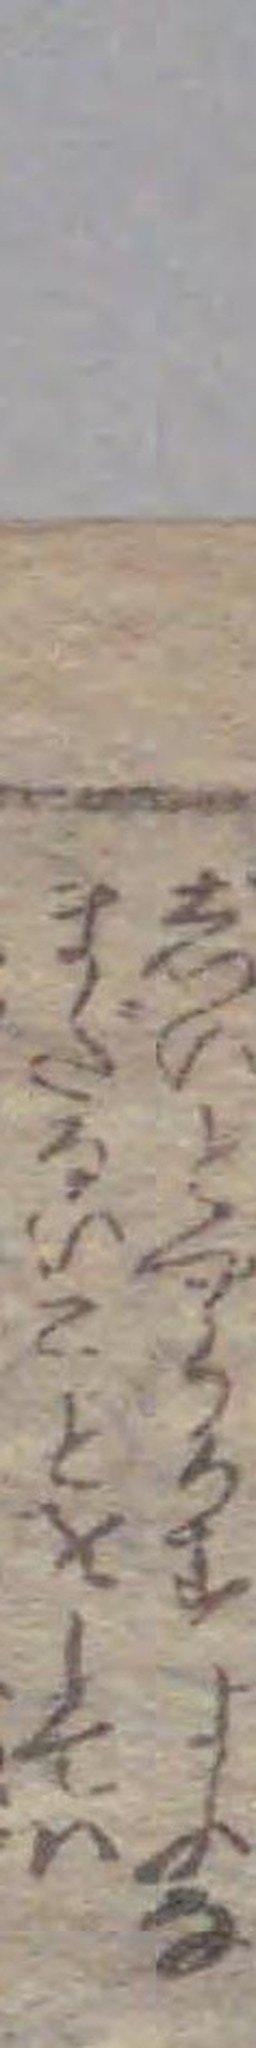まだるいことをしては
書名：[大昔化物双紙] : 2巻
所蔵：国立国会図書館 National Diet Library, JAPAN
